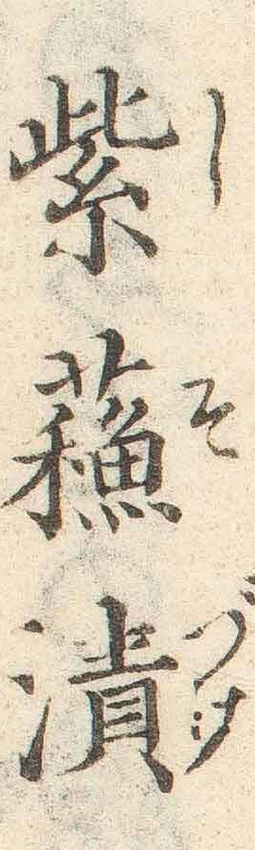紫蘇漬
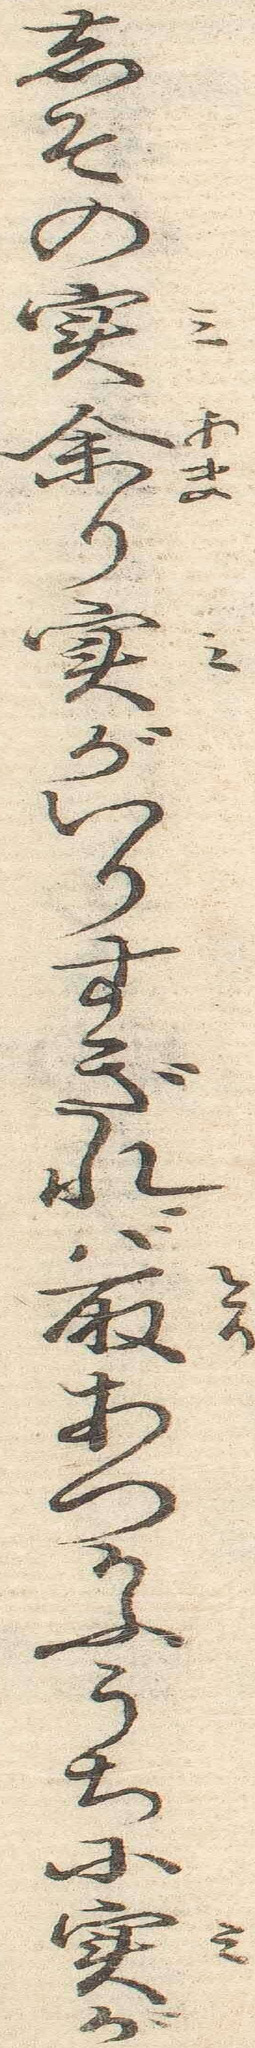しその実余り実がいりすぎれば取あつかふうちに実が

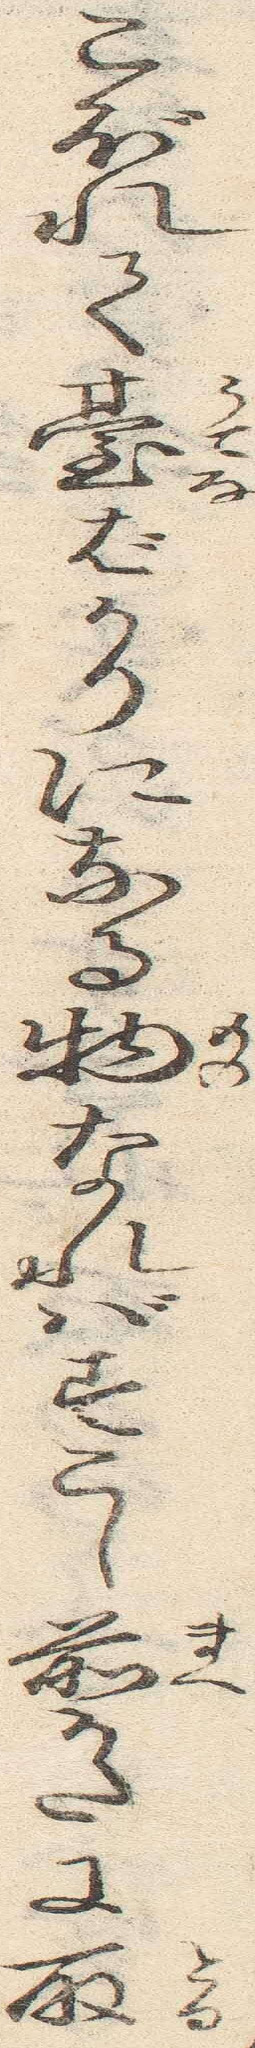こぼれて台ばかりになる物なればすこし前かたに取
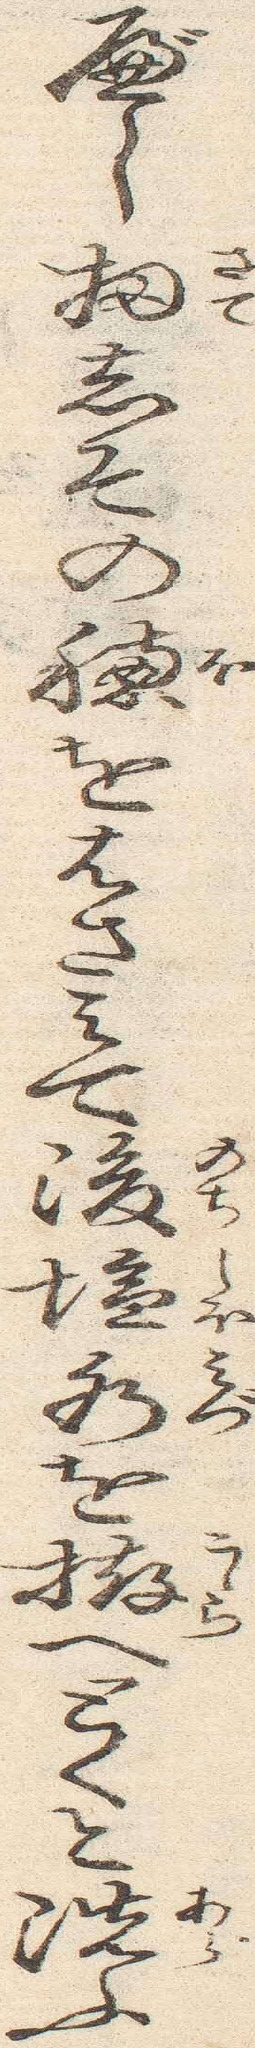べし扨しその穂をはさみて後塩水を拵へとくと洗ふ
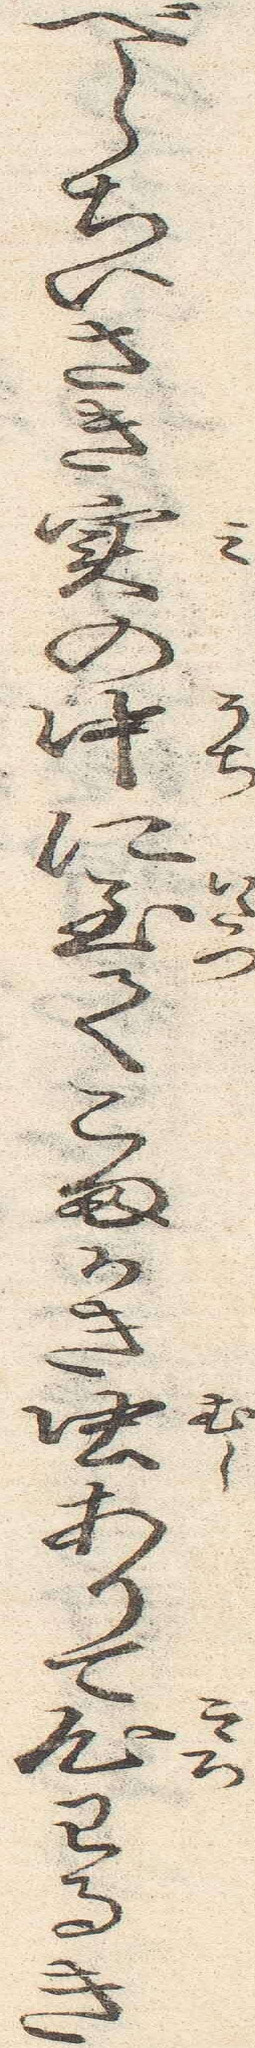べしちいさき実の中に至てこまかき虫ありて心わるき
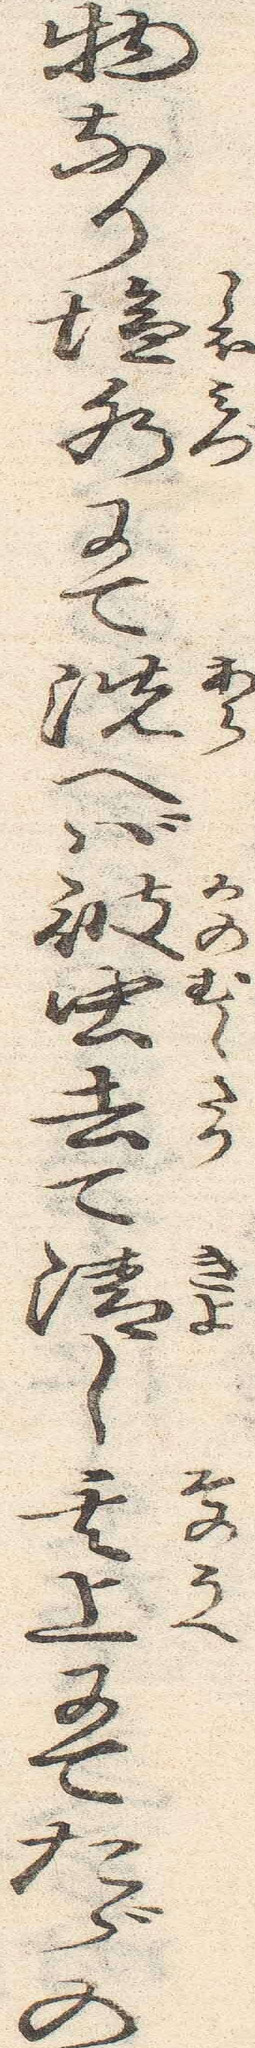物なり塩水にて洗へば彼虫去て清し其上にてたゞの
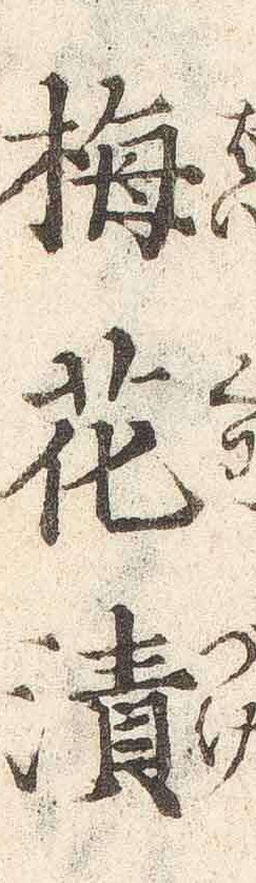梅花漬
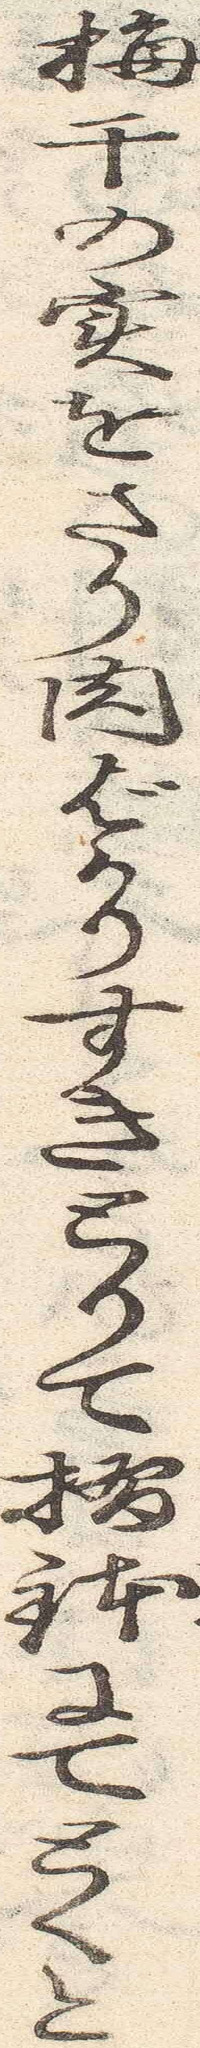梅干の実をさり肉ばかりすきとりすきとりて擂鉢にてとくと
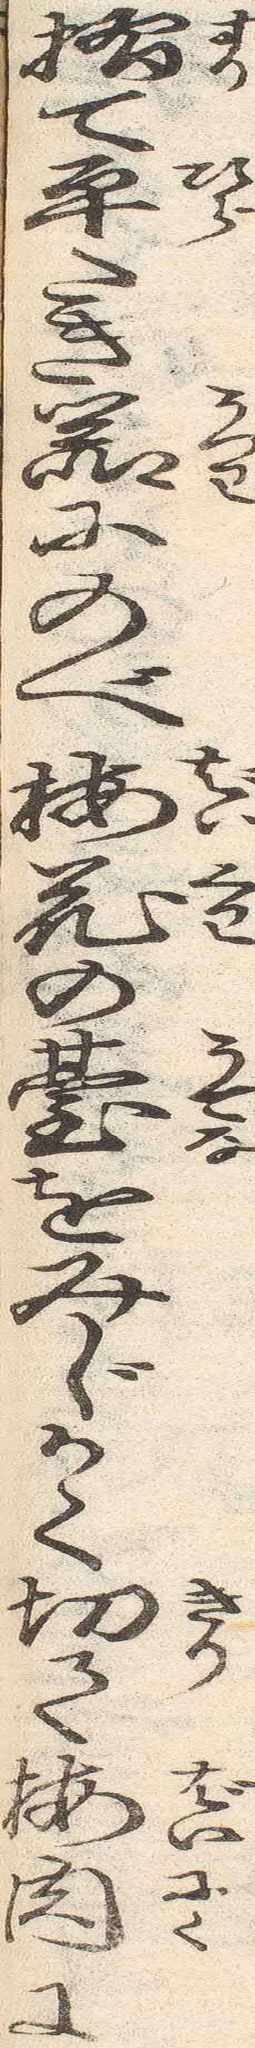擂て平たき器にのべ梅花の台をみじかく切て梅肉に
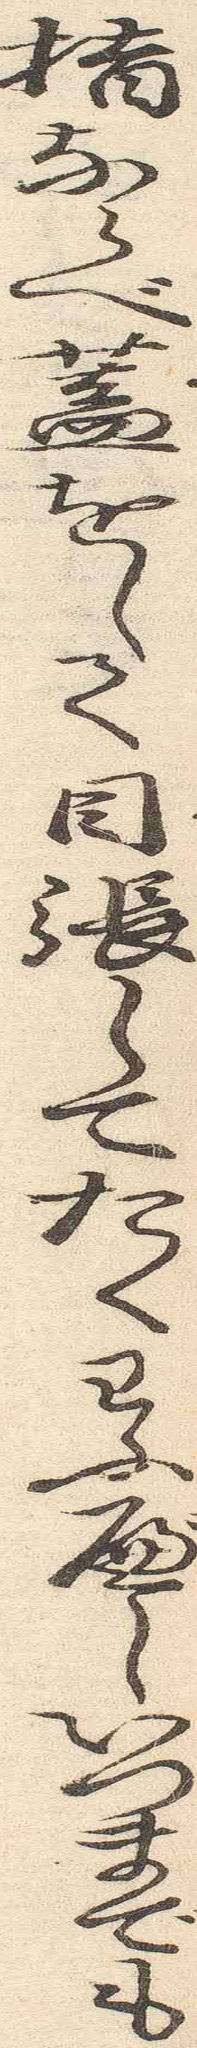指ならべ蓋をして目張してたくわふべしいつまでも
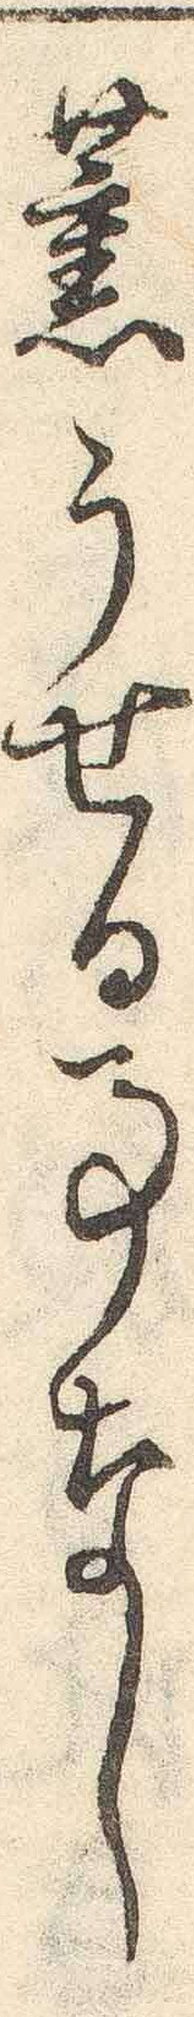薫うせる事なし
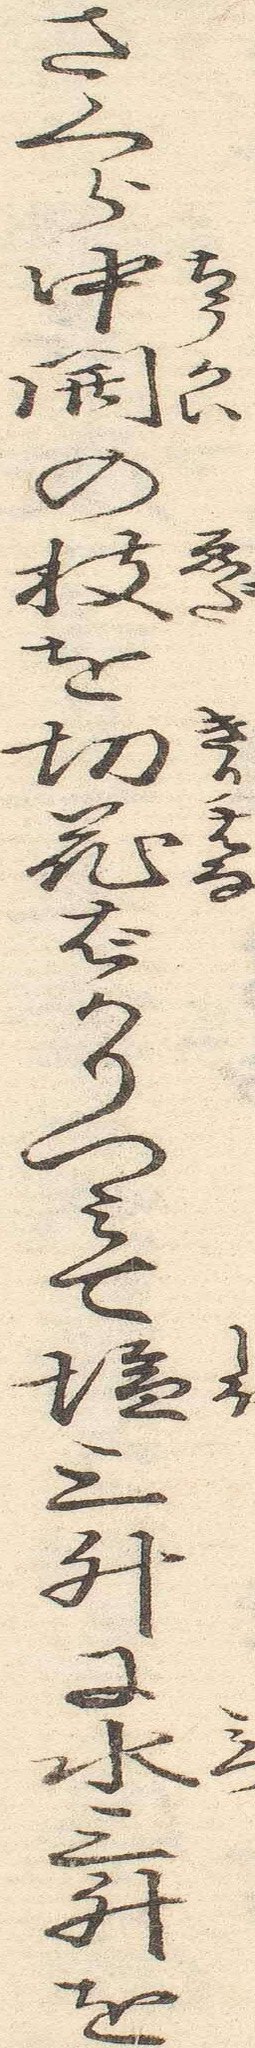さくら中開の枝を切花ばかりつみて塩三升に水三升を
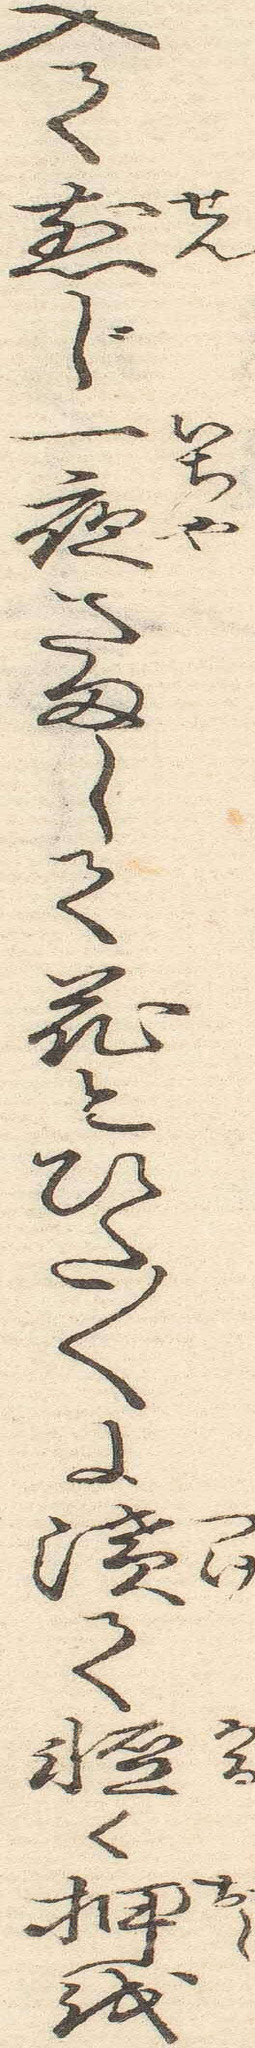入れて煎じ一夜さまして花とひた〳〵に漬て軽く押を
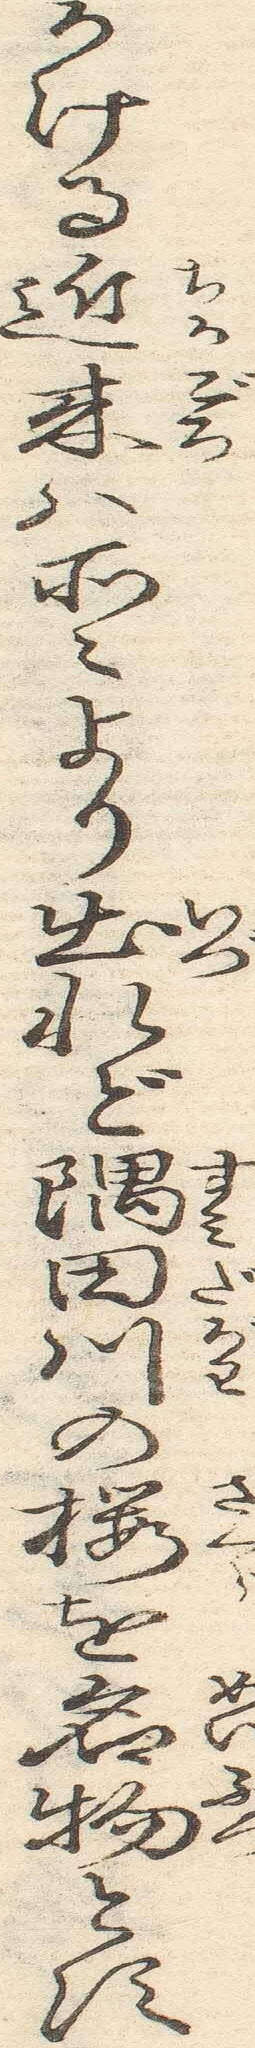かける近来は所々より出れど隅田川の桜を名物とす
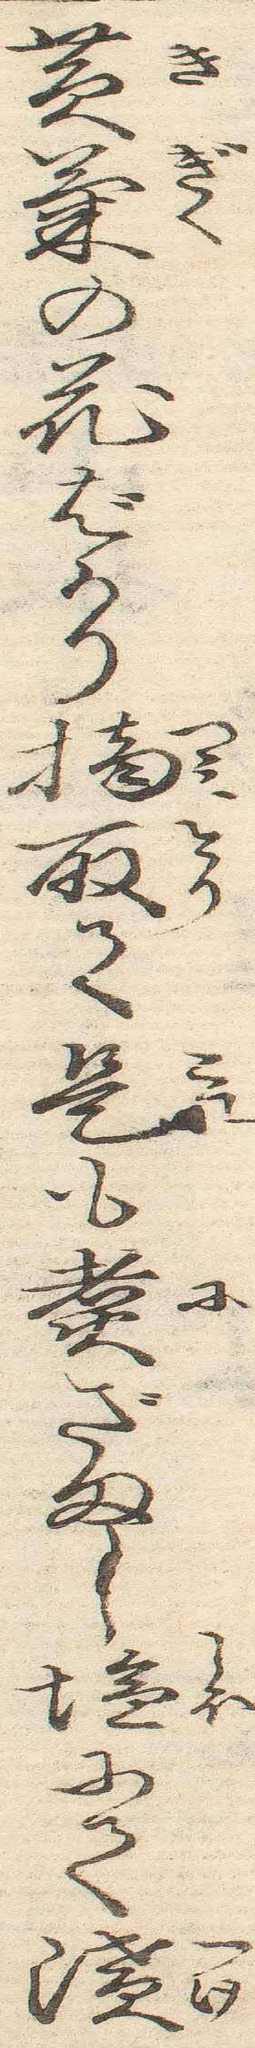黄菊の花ばかり摘取て是も煮ざまし塩にて漬
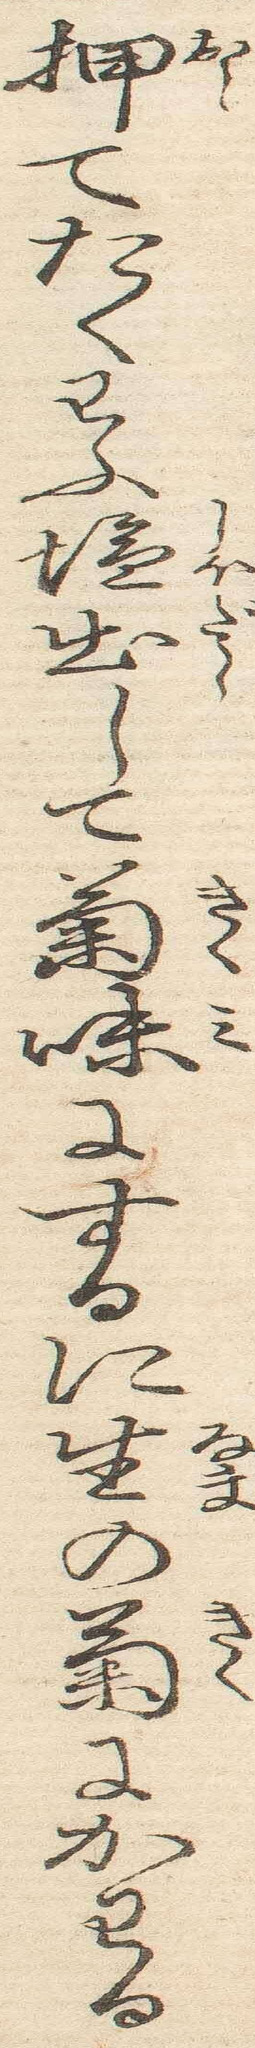押てたくわふ塩出して菊味にするに生の菊にかわる
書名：四季漬物塩嘉言
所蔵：東京学芸大学附属図書館 国文学研究資料館
